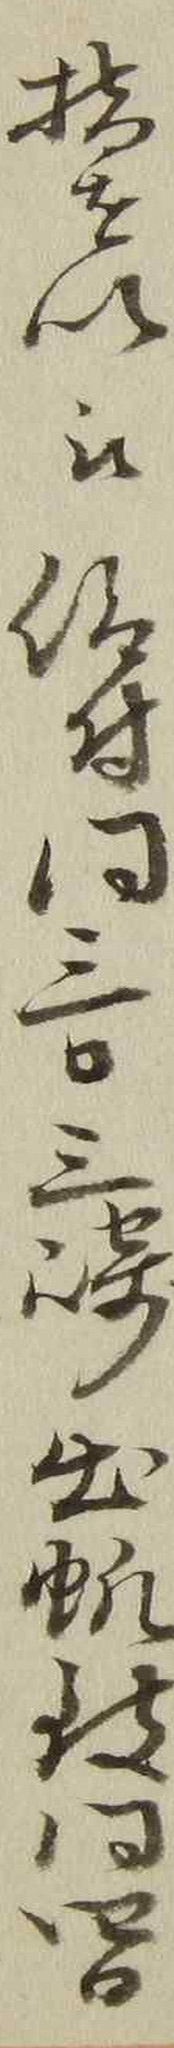指を以被仰付同三日三崎出帆致同四日
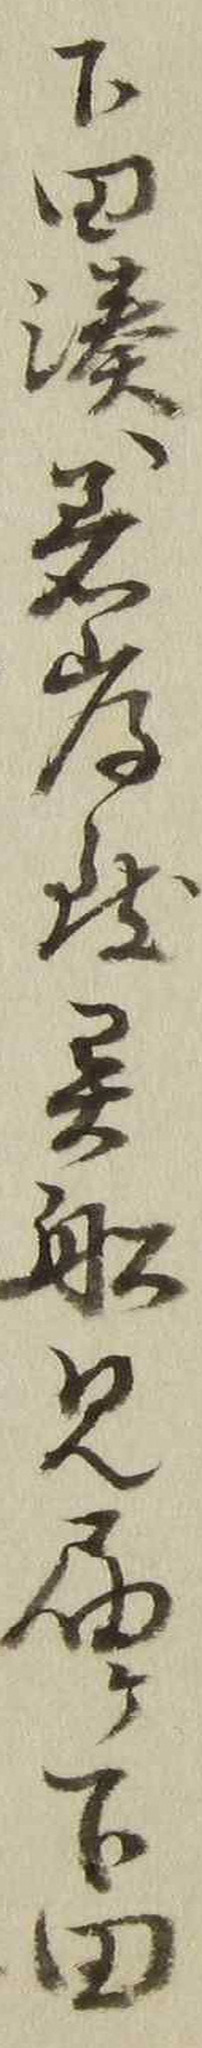下田湊へ着岸致異船見届ヶ下田
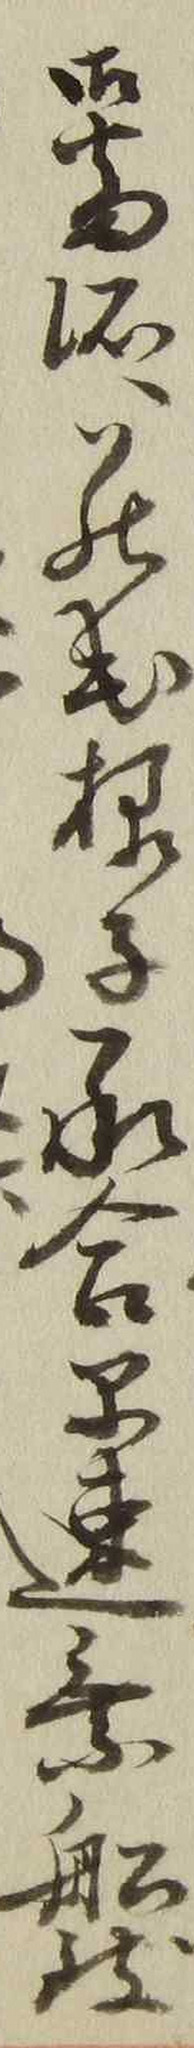御番所へ罷出様子承合早速乗船致
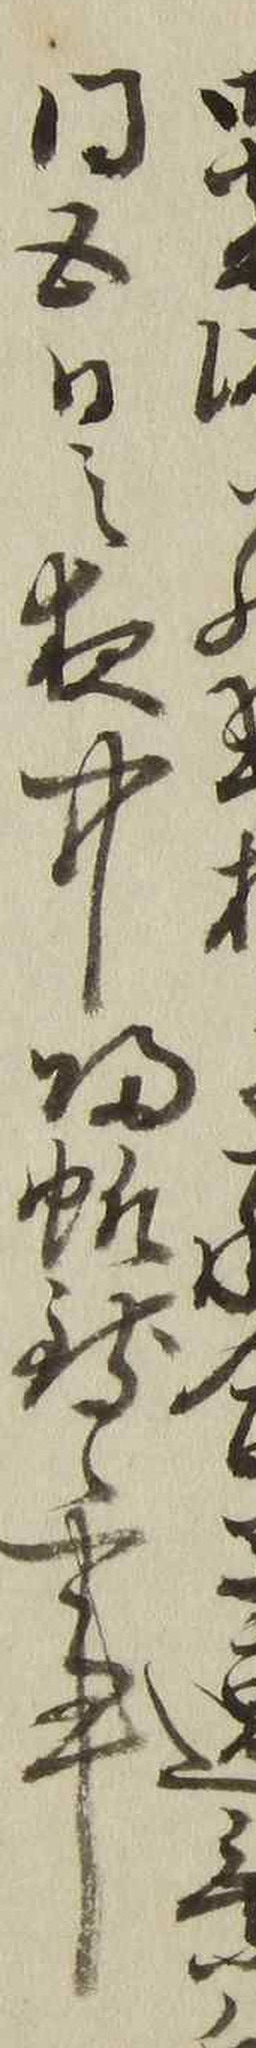同五日之夜中帰帆致候事
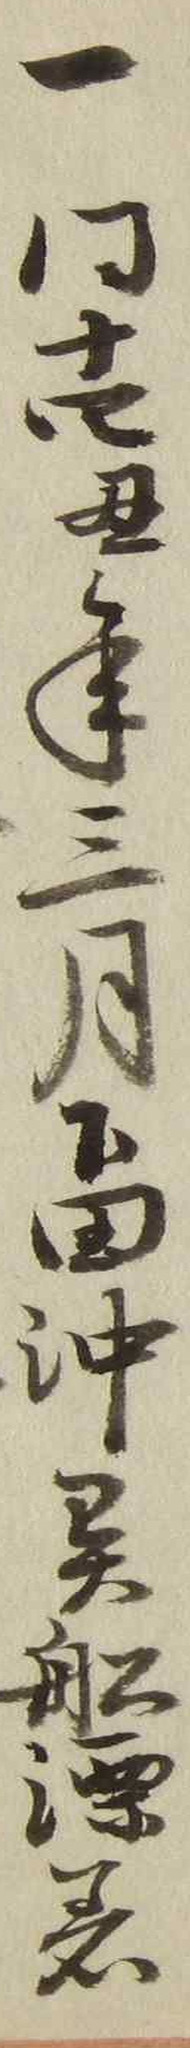一同十四丑年三月下田沖異船漂着
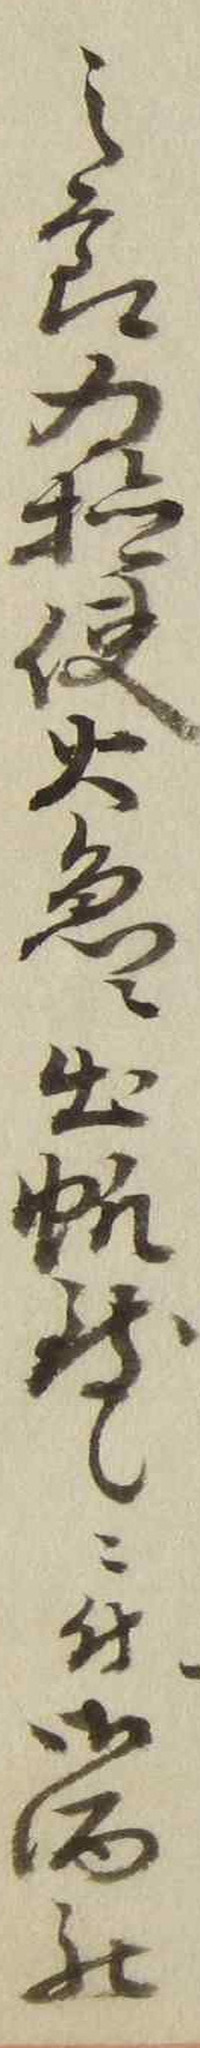之節為検使火急ニ出帆致候ニ付御酒被

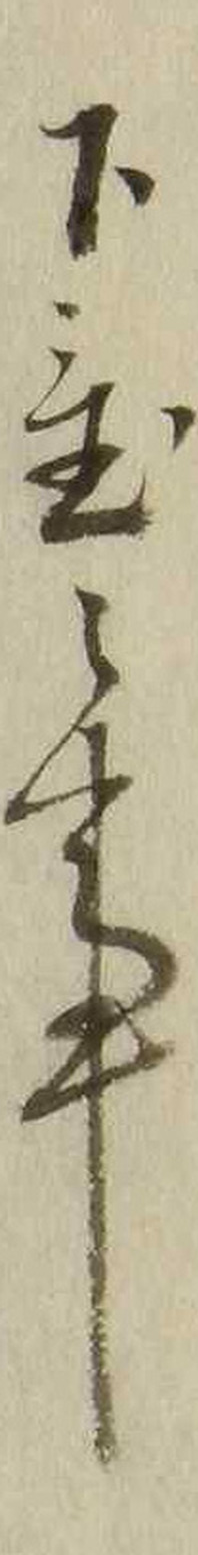下置之事
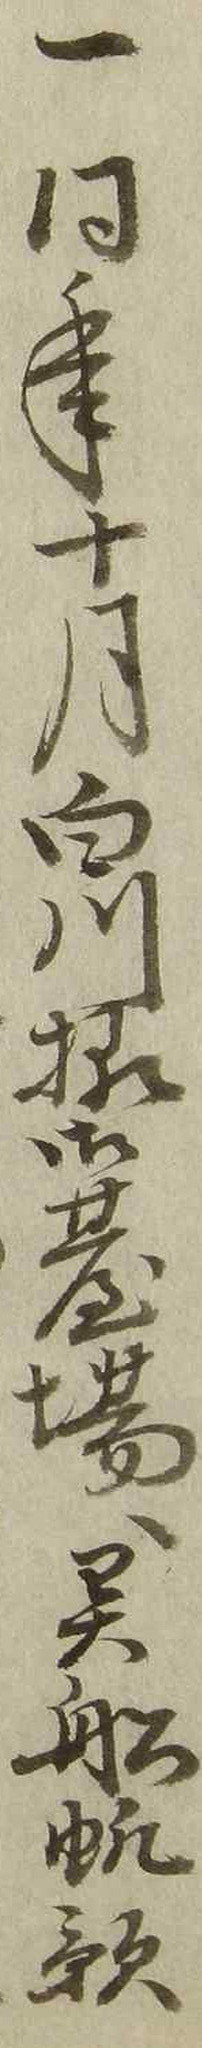一同年十月白川様御台場へ異船帆歓
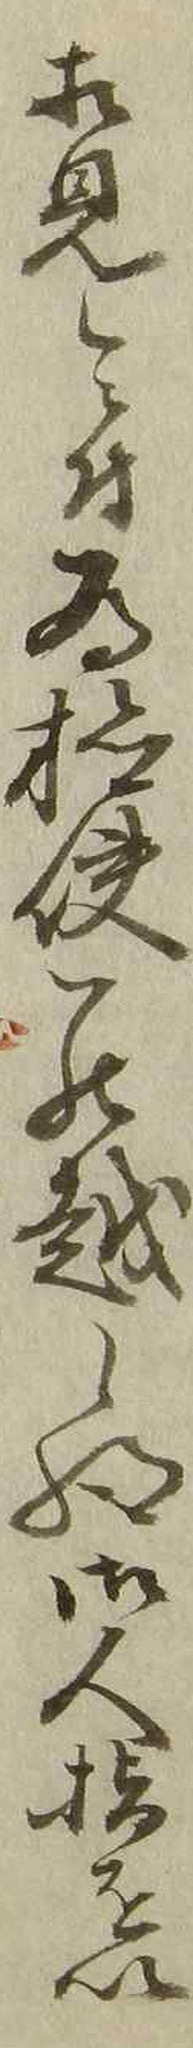相見候ニ付為検使罷越候様御人指を以
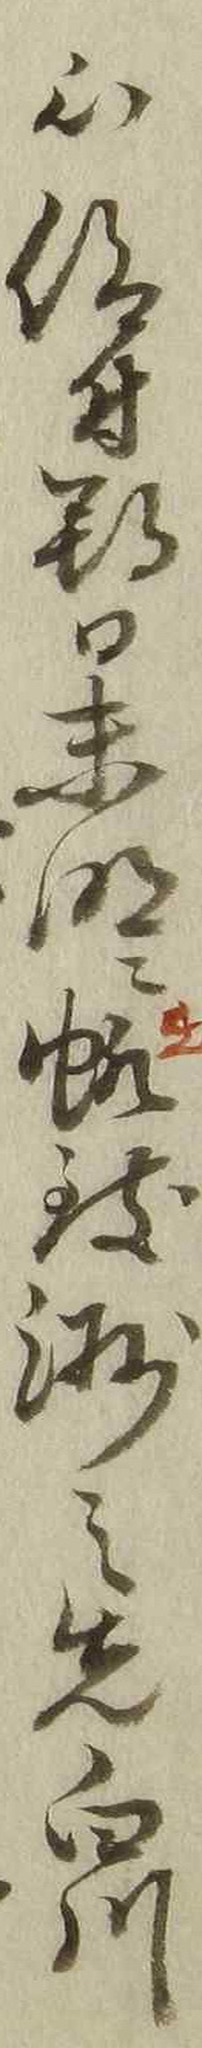被仰付朔日未明ニ出帆致洲之先白川
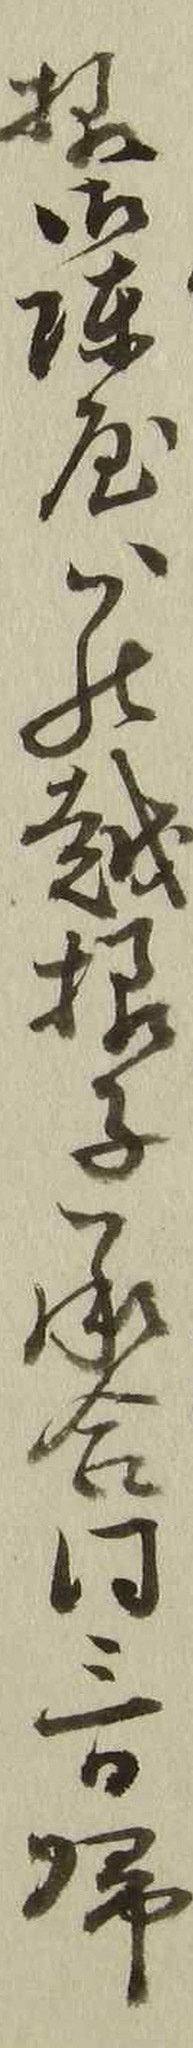様御陣屋へ罷越様子承合同三日帰
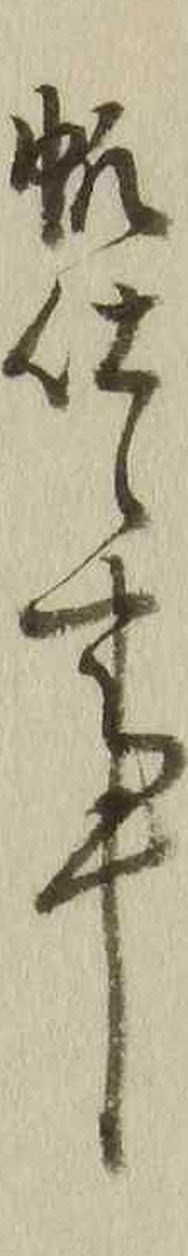帆仕候事
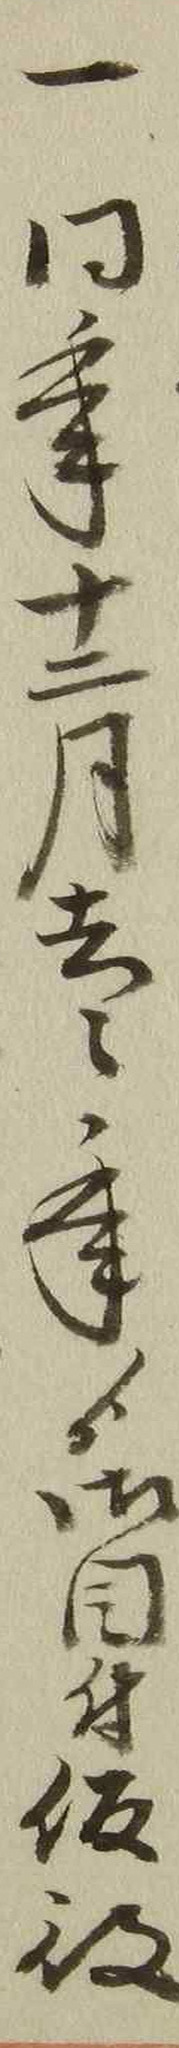一同年十二月去々年ゟ御目付仮役
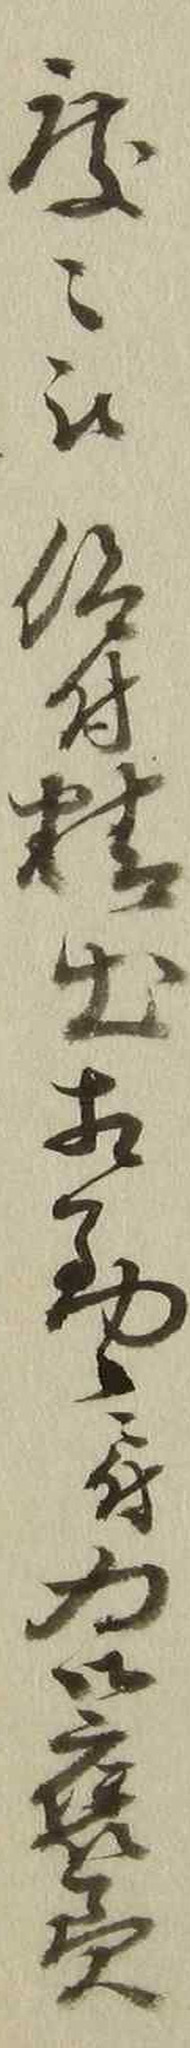度々被仰付精出相勤候ニ付為御褒美
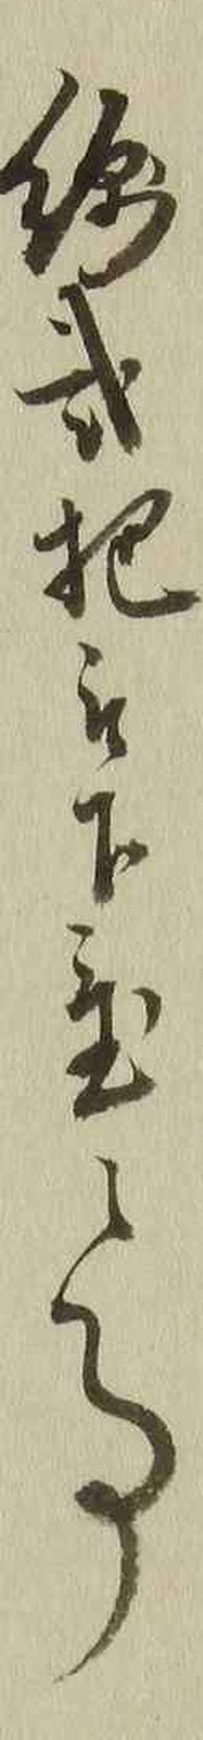綿弐把被下置候事
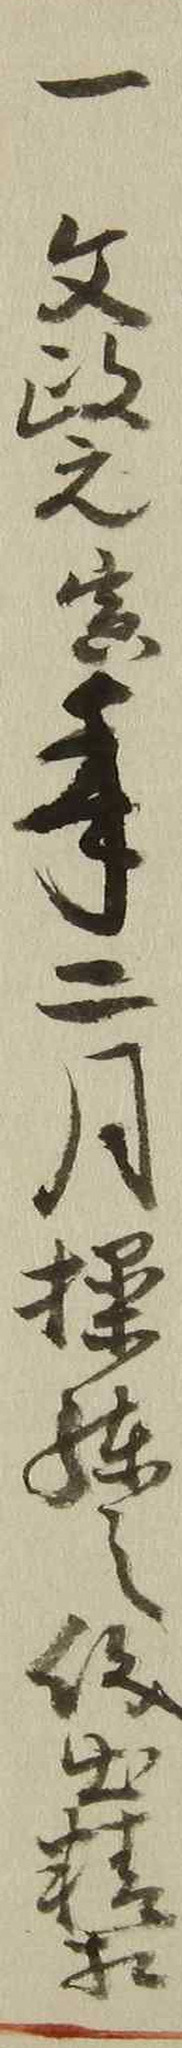一文政元寅年二月操練之儀出精相
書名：諸士系譜　巻之53　に之部4
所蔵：会津若松市立会津図書館
